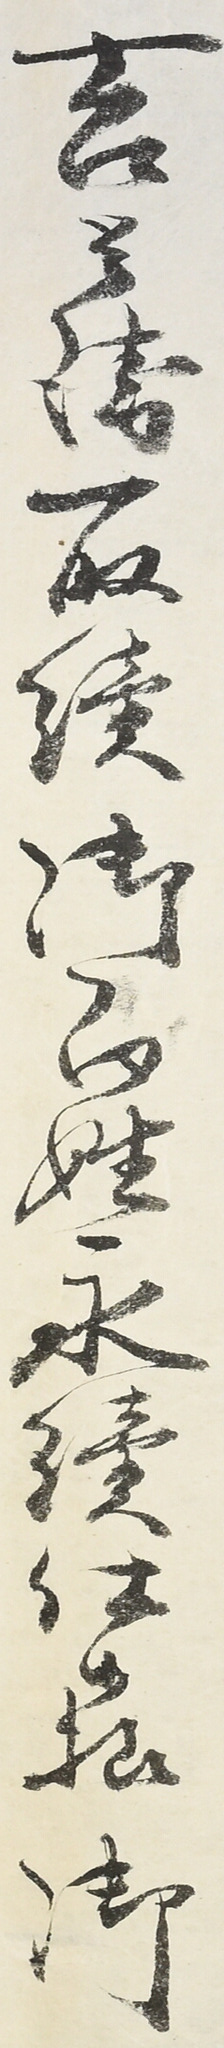吉兵衛取続御百姓永続仕候様御
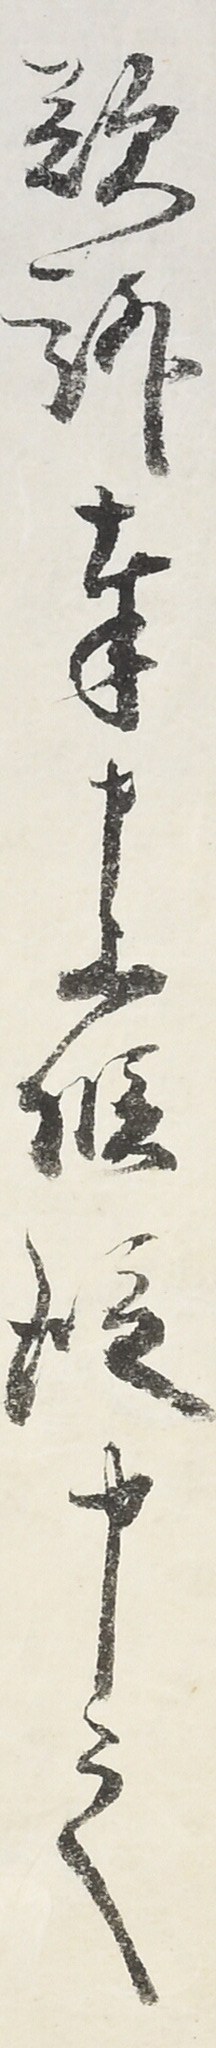歎訴奉申上候段申之
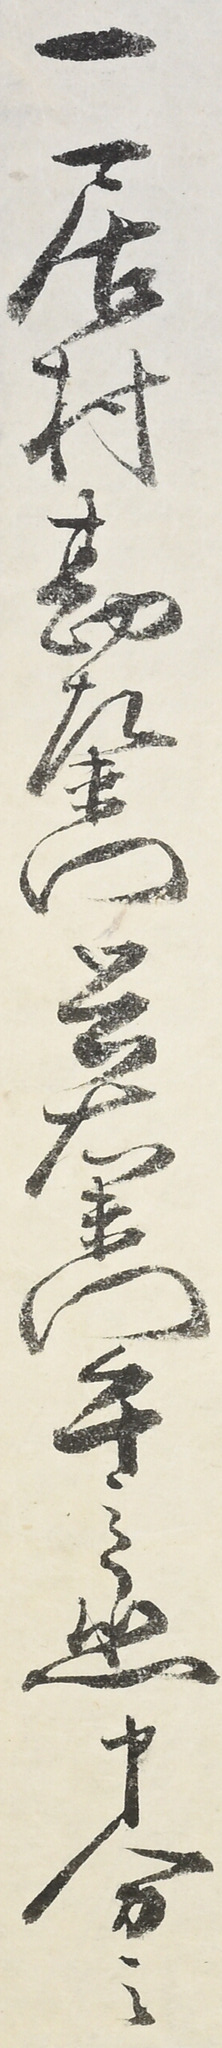一居村勘左衛門兵右衛門午之烝申分之
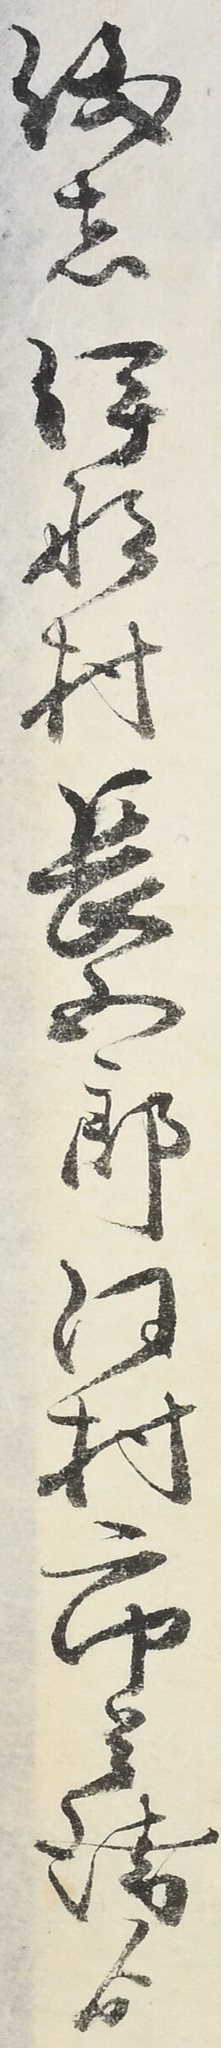儀者伊那村長五郎同村市兵衛ゟ
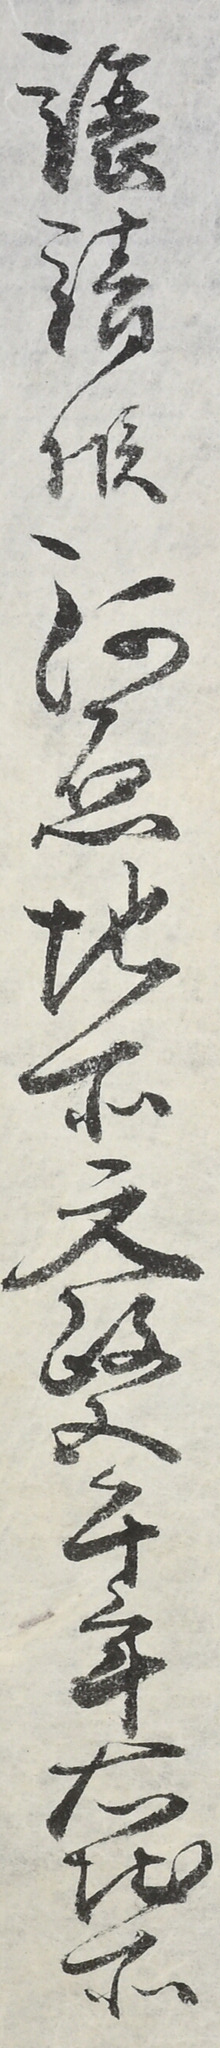譲請候河原地所文政五午年右地所
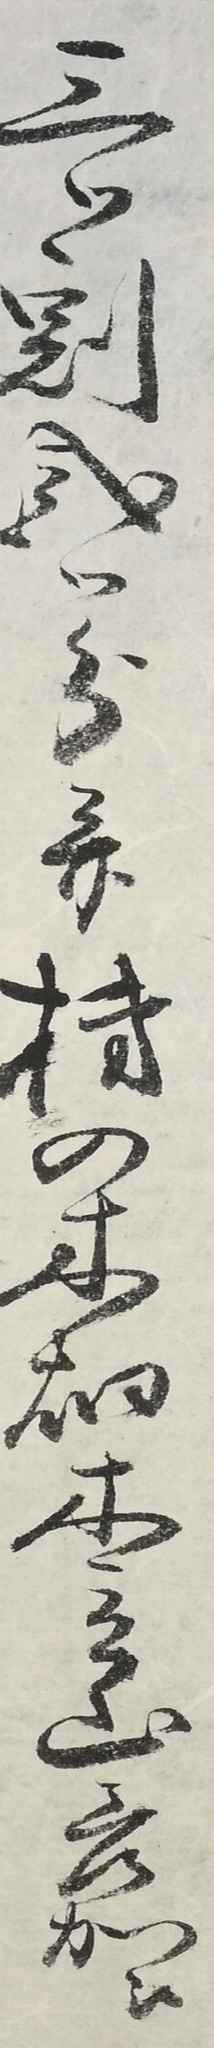三ツ割弐ツ分幷柿の木畑木立山差加江
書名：差上申済口一札之事
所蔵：伊那市立高遠町図書館・合同会社AMANE
